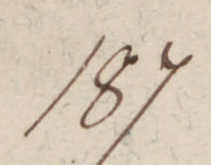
187
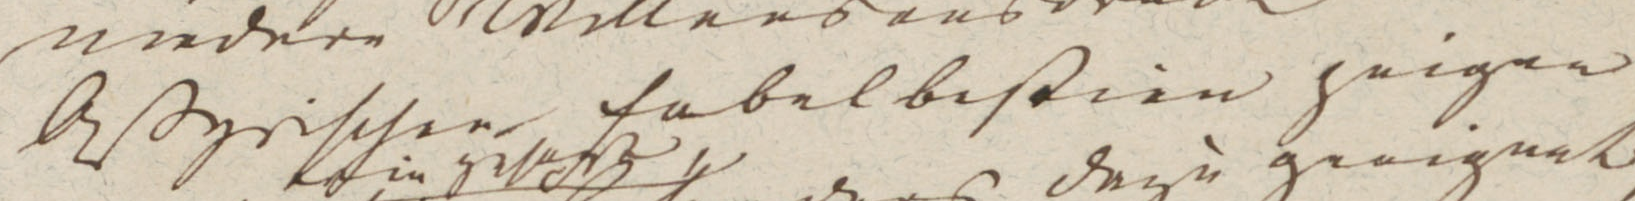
Assyrischen Fabelbestien zeigen
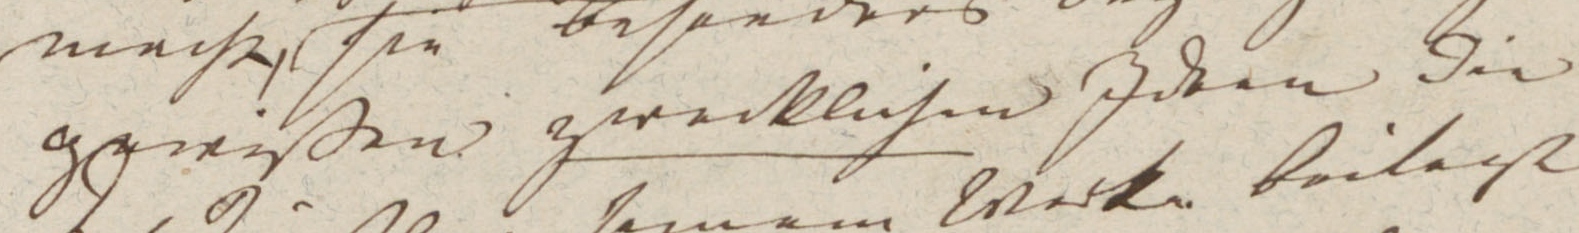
gewissen zwecklichen Ideen die
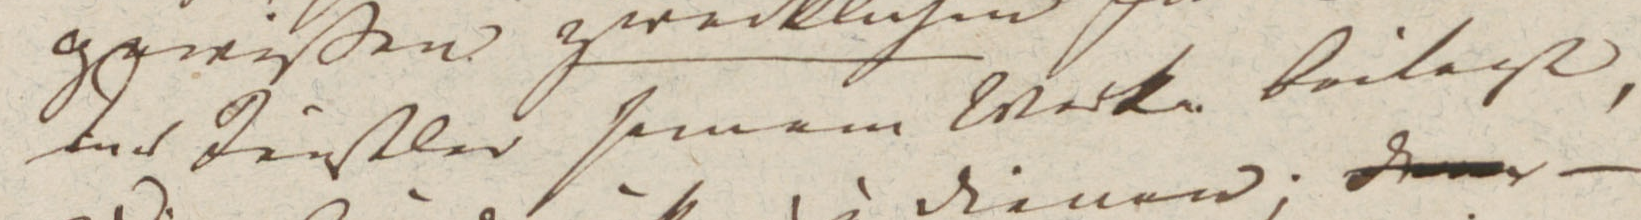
der Künstler seinem Werke beilegt,
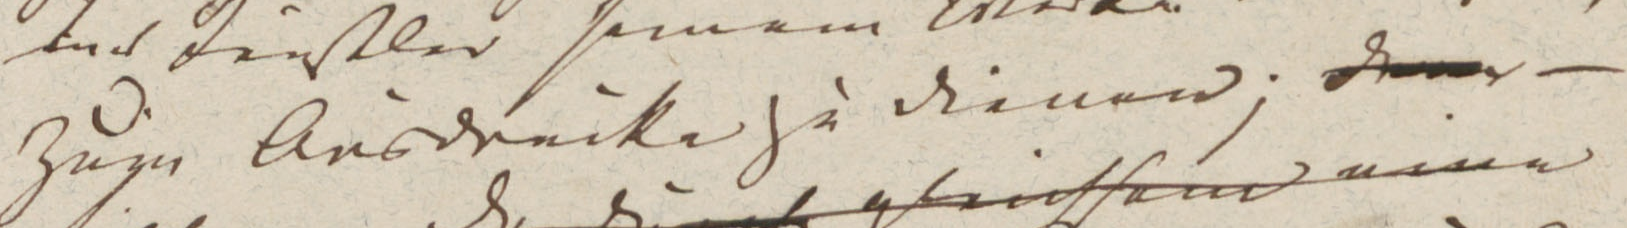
zum Ausdrucke zu dienen; dem-
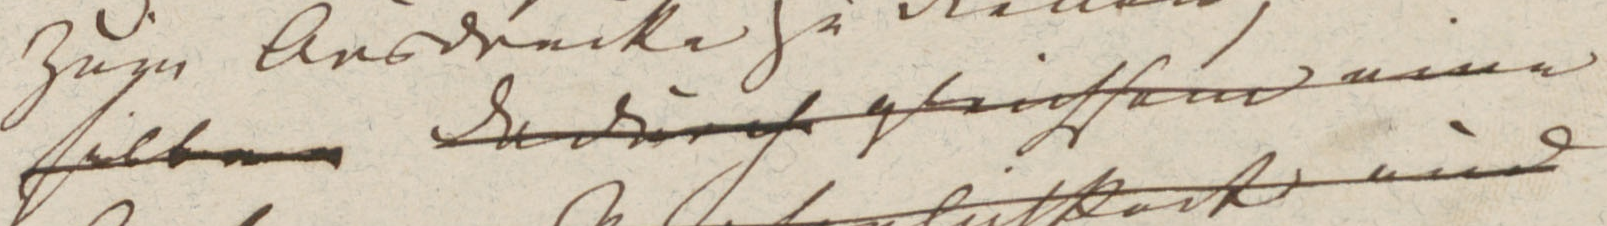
selben Dadurch gleichsam eine
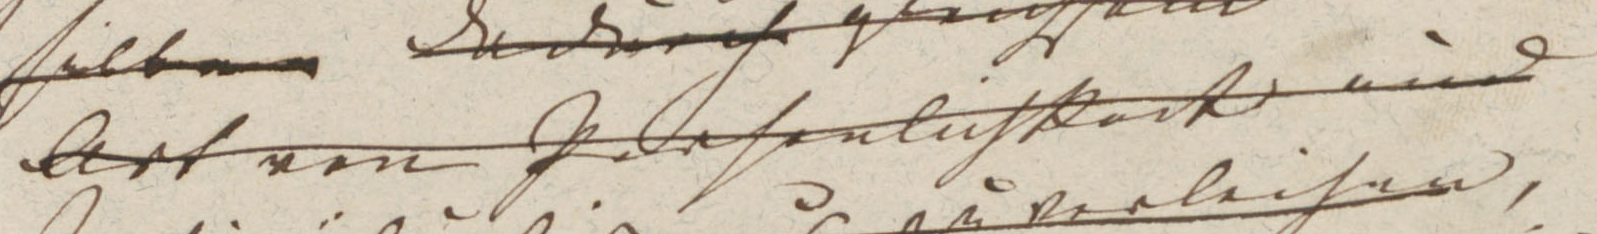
Art von Personlichkeit und
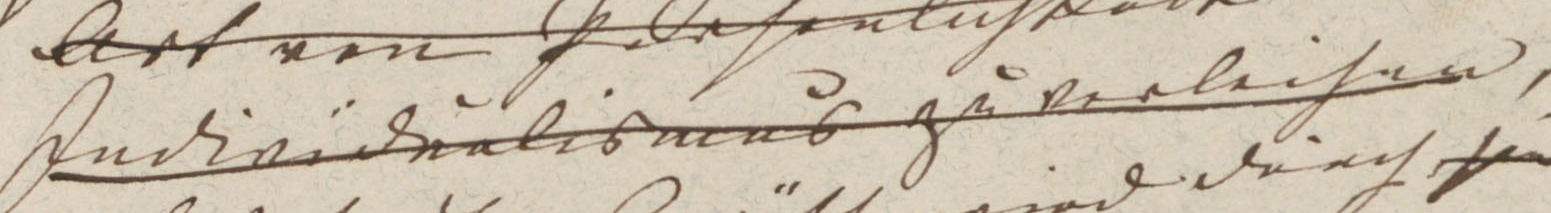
Inidvidualismus zu verleihen,
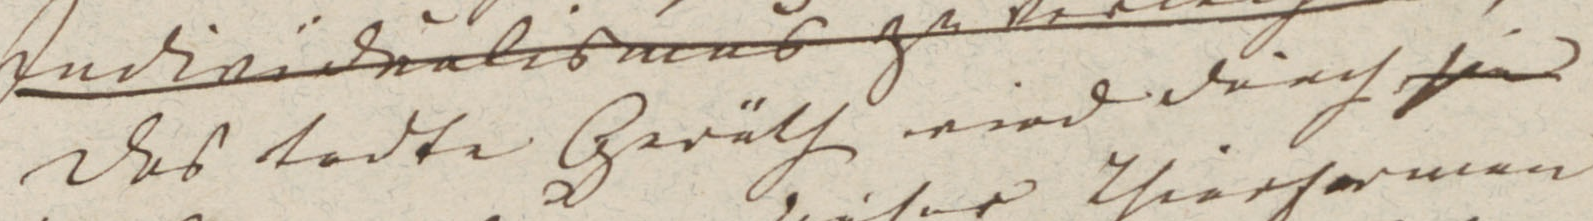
Das todte Geräth wird durch sie
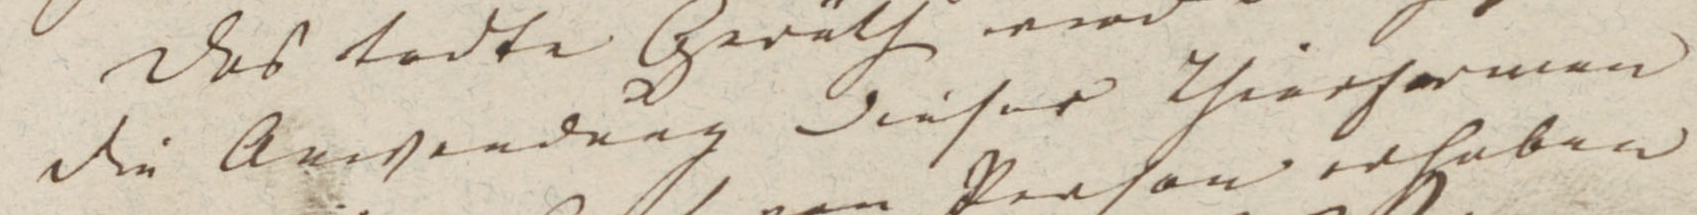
die Anwendung dieser Thierformen
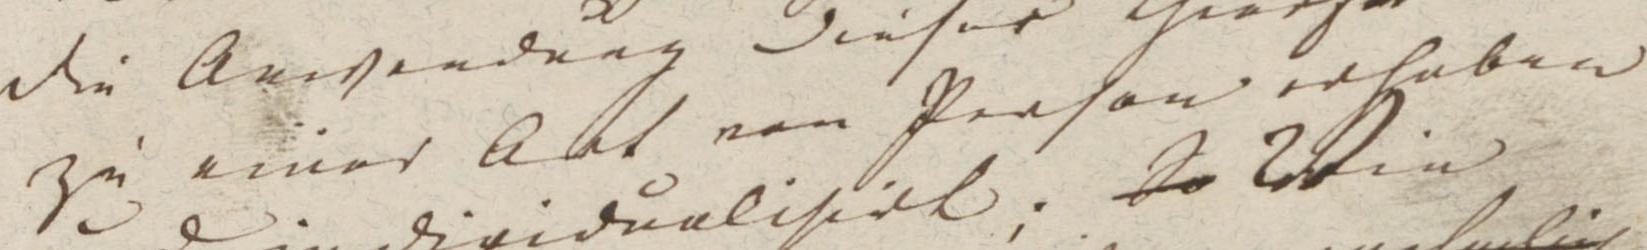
zu einer Art von Person erhoben
